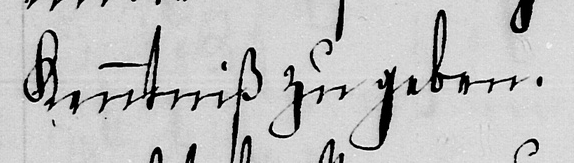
Kenntniß zu geben.
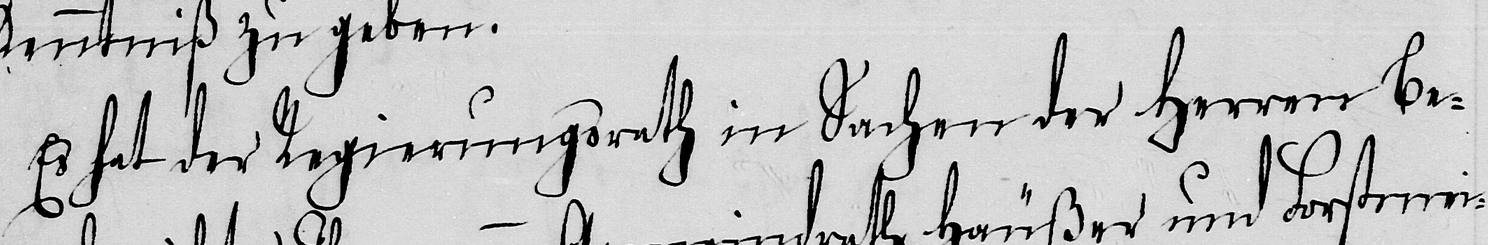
Es hat der Regierungsrath in Sachen der Herren Be¬
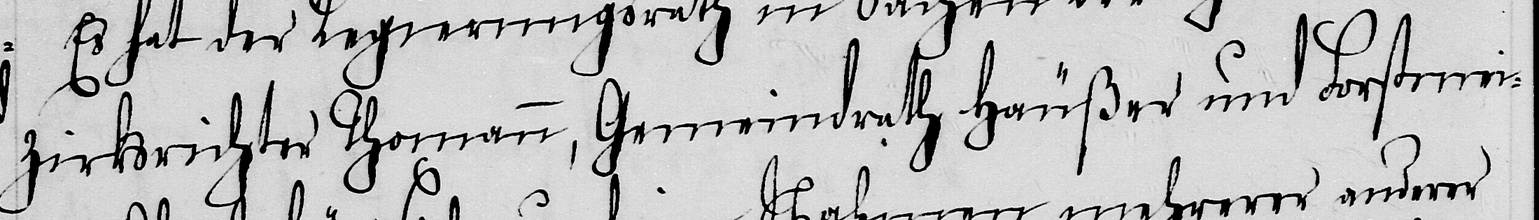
zirksrichter Thomann, Gemeindrath Häußer und Forstmei¬
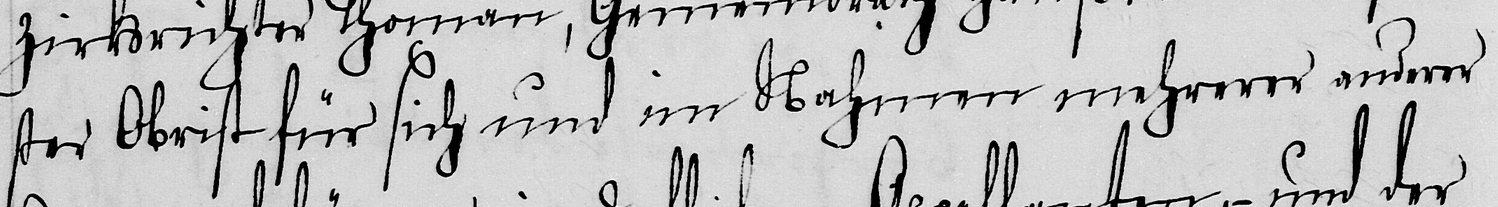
ster Obrist für sich und im Nahmen mehrerer anderer
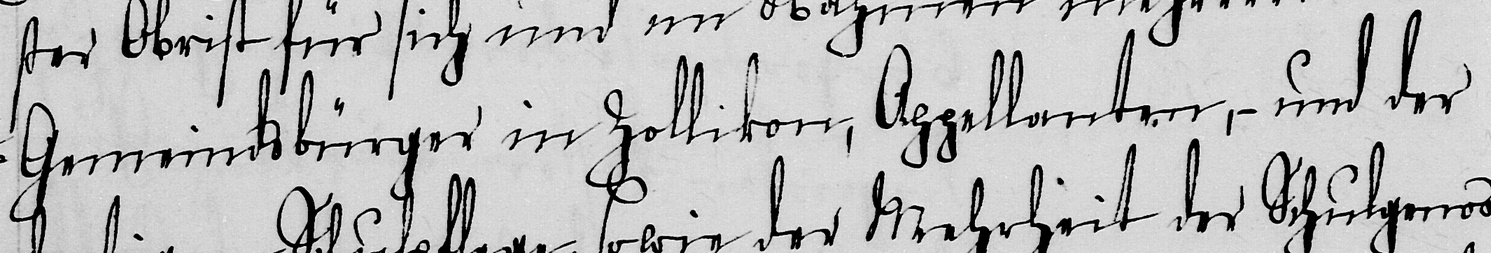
Gemeindsbürger in Zollikon, Appellanten, – und der
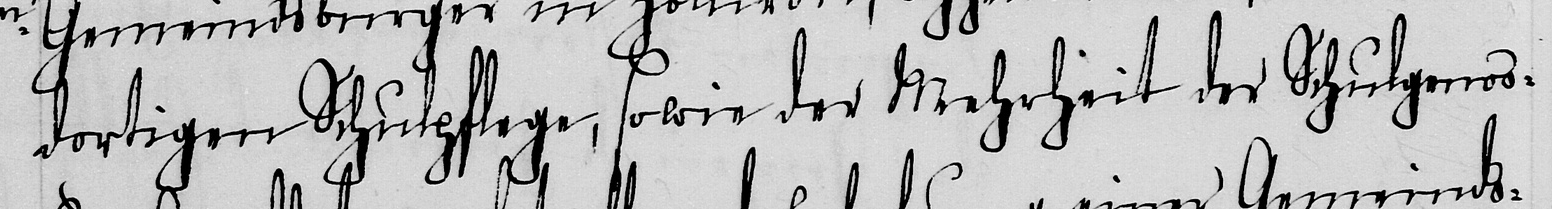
dortigen Schulpflege, sowie der Mehrheit der Schulgenoß¬
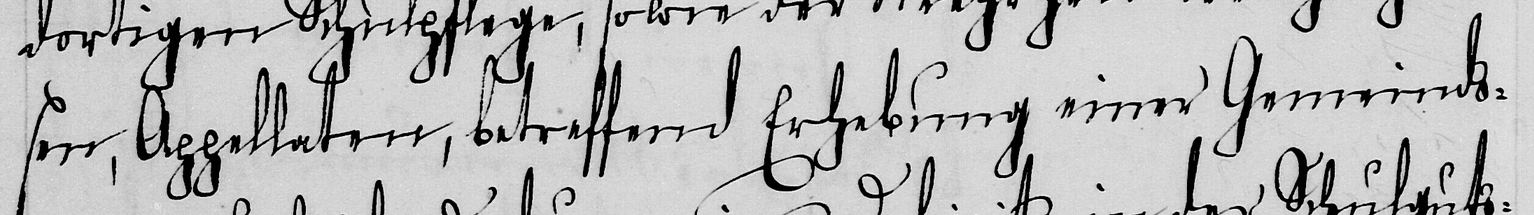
en, Appellaten, betreffend Erhebung einer Gemeinds¬
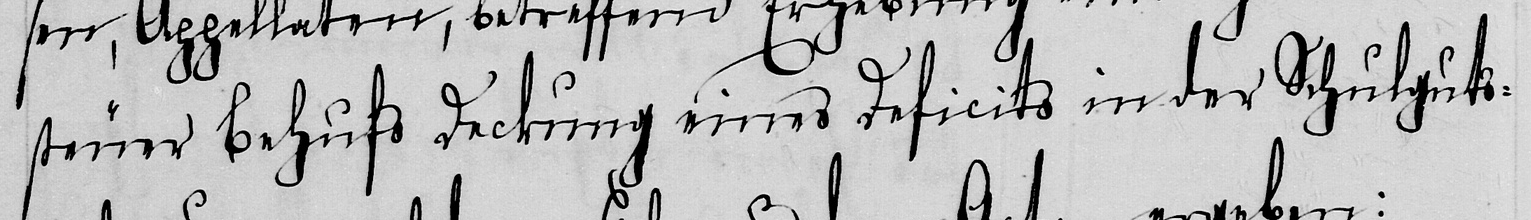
steuer Behufs Deckung eines Deficits in der Schulguts¬
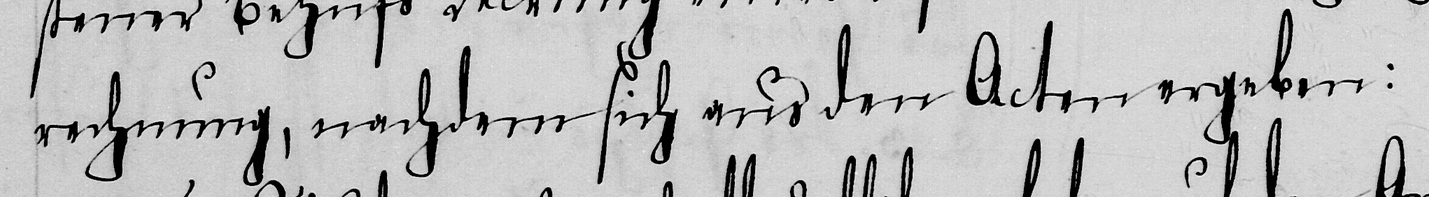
rechnung, nachdem sich aus den Acten ergeben:
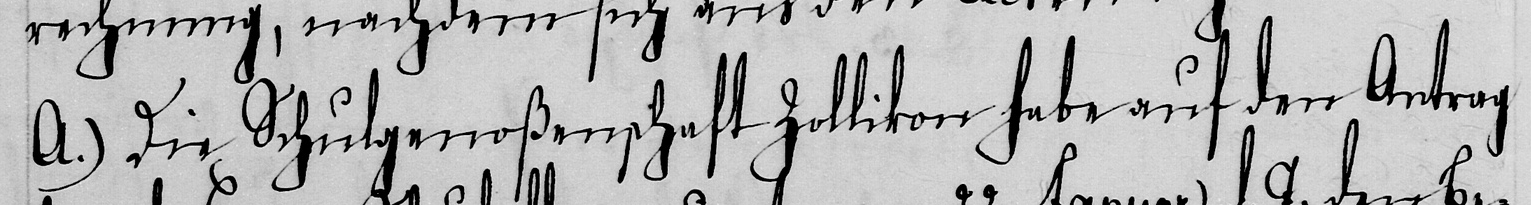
A.) Die Schulgenoßenschaft Zollikon habe auf den Antrag
